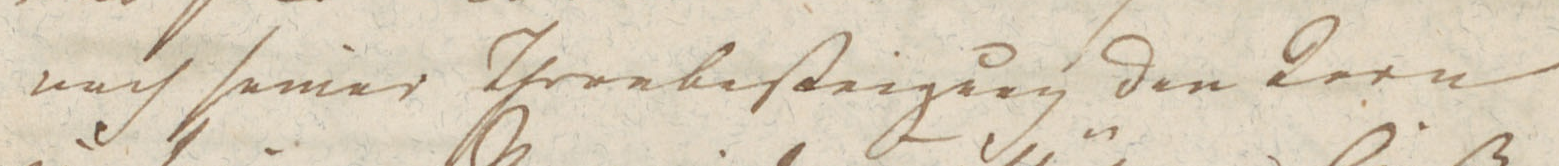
nach seiner Thronbesteigung den Kern
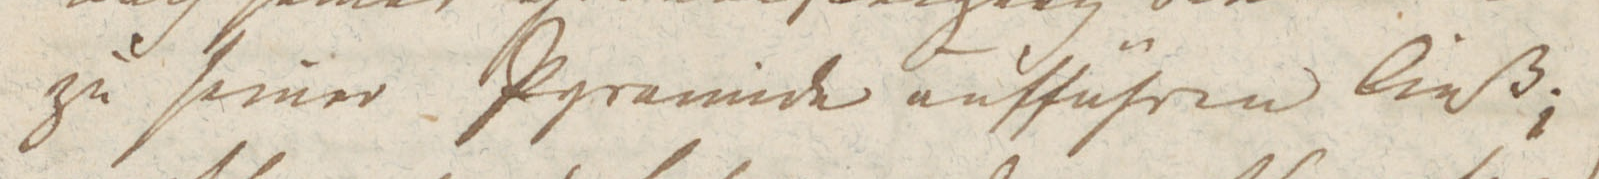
zu seiner Pyramide aufführen liess;
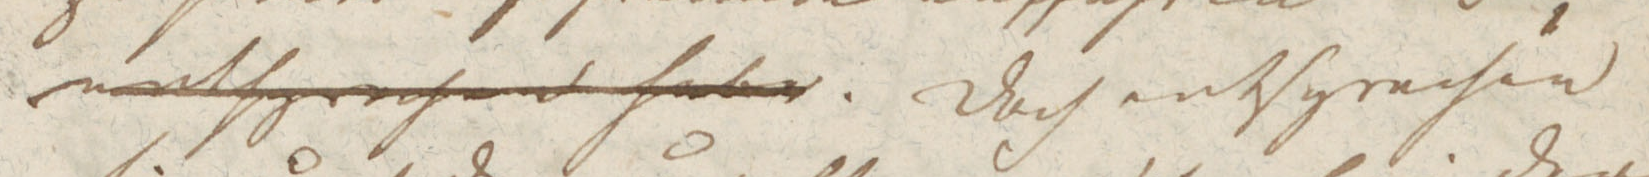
entsprochen habe. Doch entsprechen
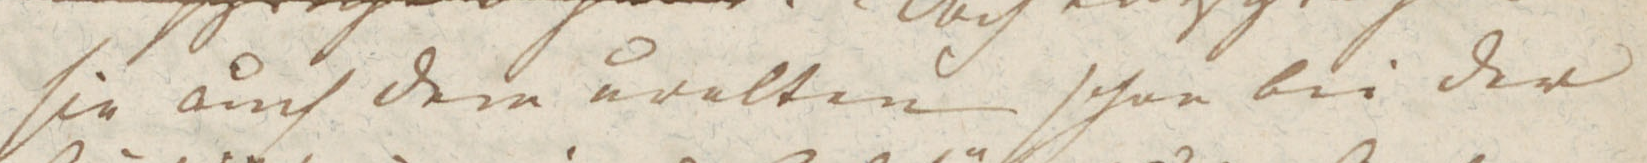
sie auch dem uralten schon bei der
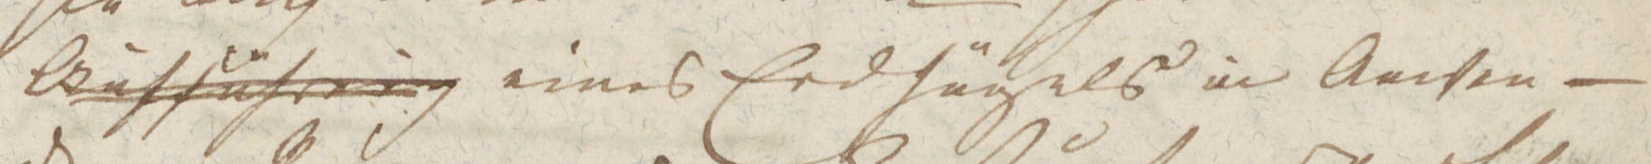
Aufführung eines Erdhügels in Anwen-
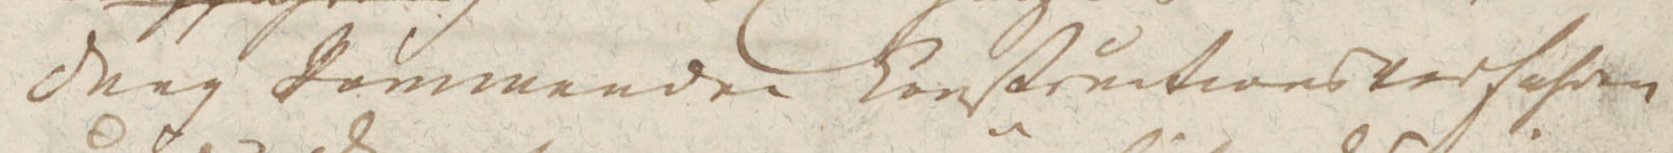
dung kommenden Constructionsverfahren
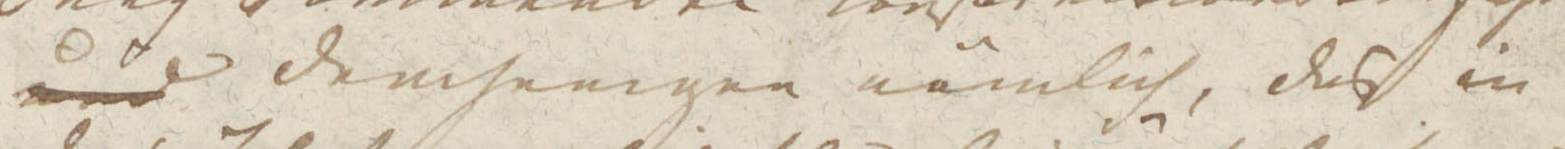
und demjenigen nämlich, das in
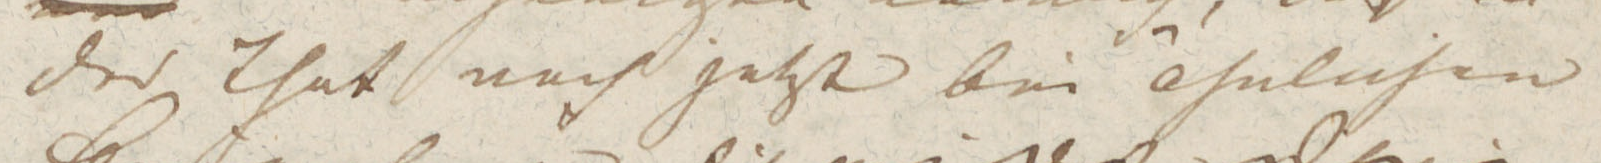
der That noch jetzt bei ähnlichen
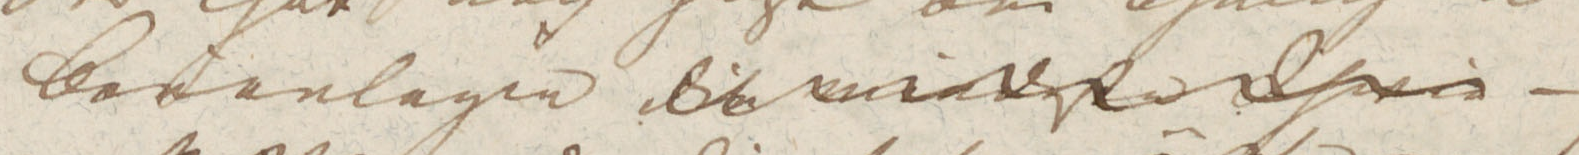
Bauanlagen die mindeste Schwie-
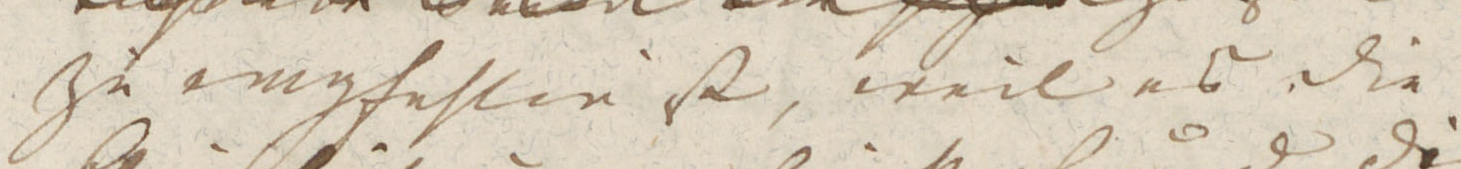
zu empfehlen ist, weil es die
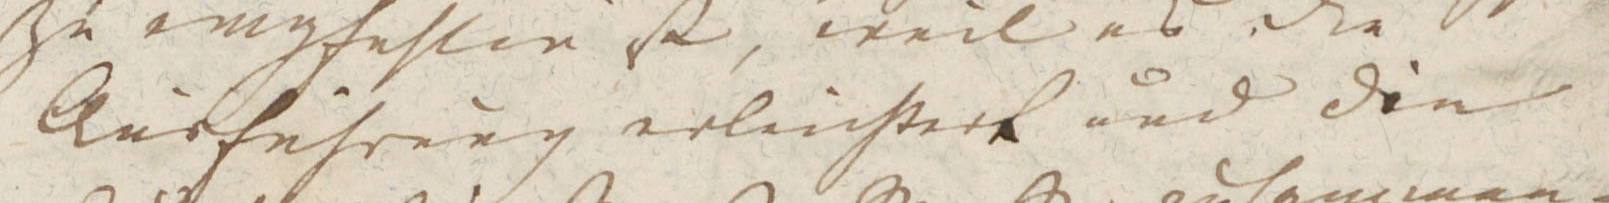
Ausführung erleichtert und die
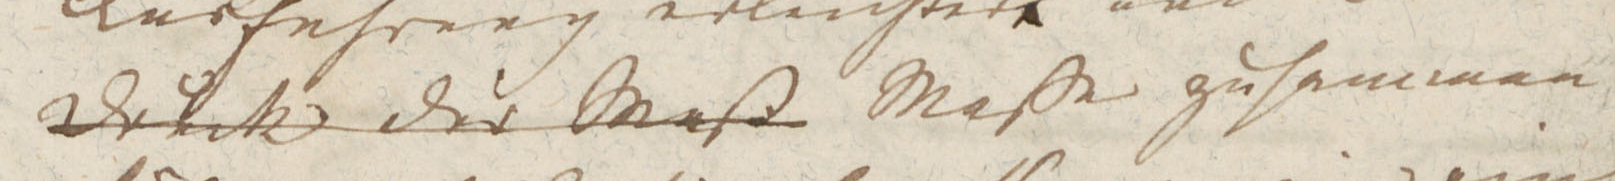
Druck der Mass Masse zusammen-
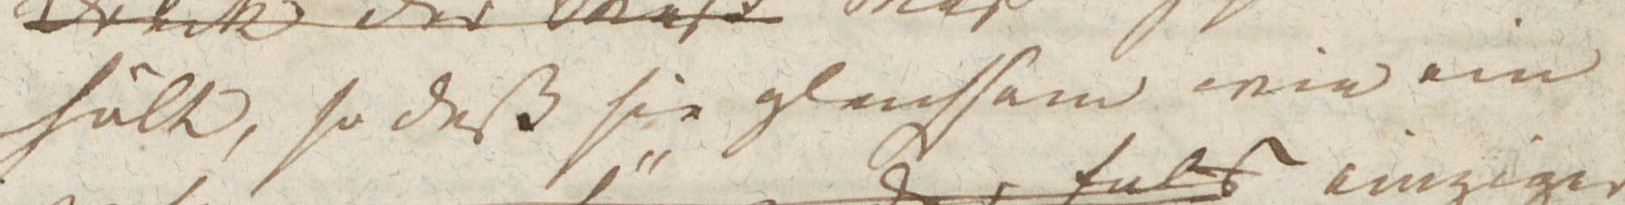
hält, so dass sie gleichsam wie ein
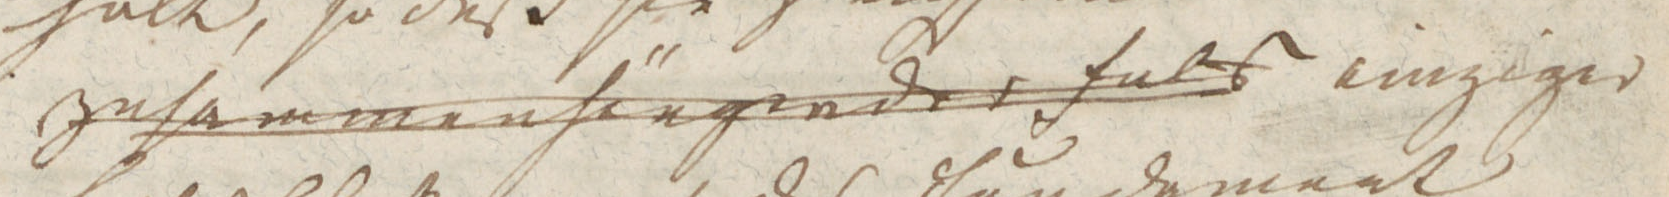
zusammenhängender Fels einziger
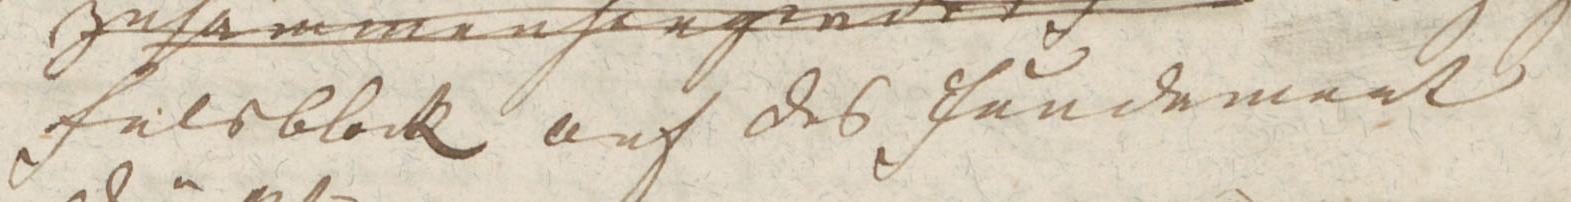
Felsblock auf das Fundament
